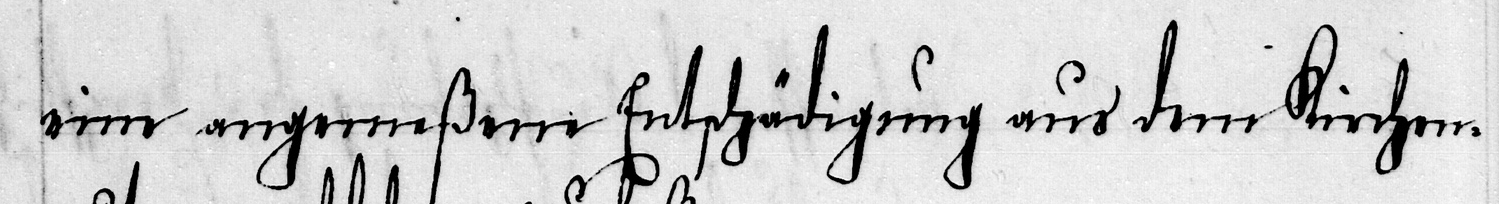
eine angemeßene Entschädigung aus dem Kirchen¬
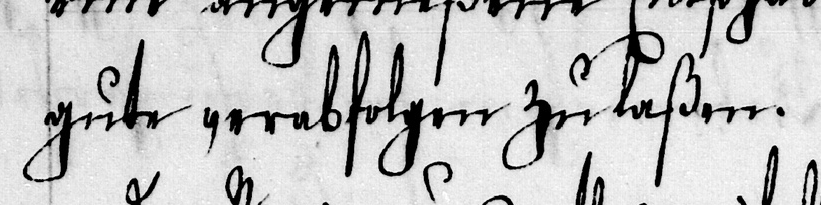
gute verabfolgen zu laßen.
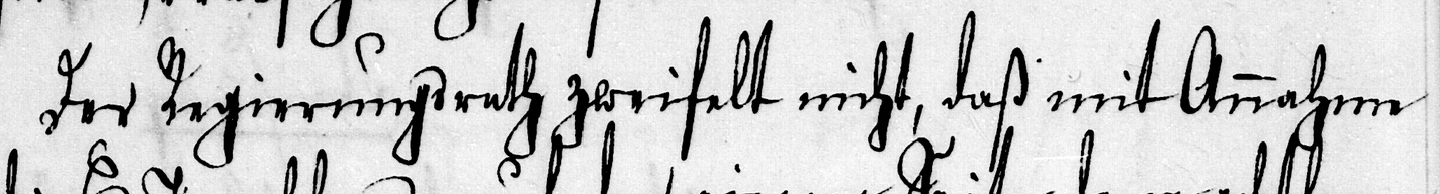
Der Regierungsrath zweifelt nicht, daß mit Annahme
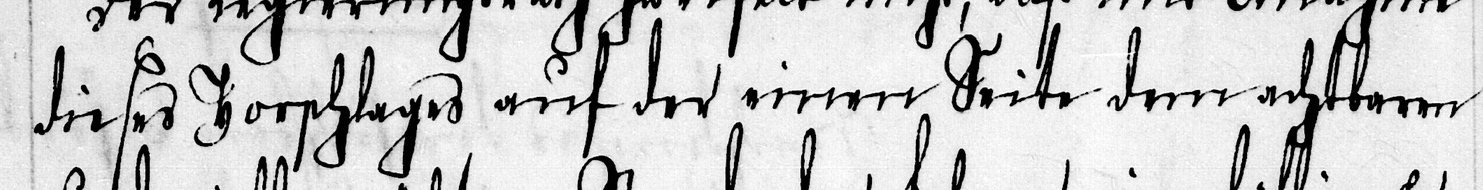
dieses Vorschlages auf der einen Seite dem achtbaren
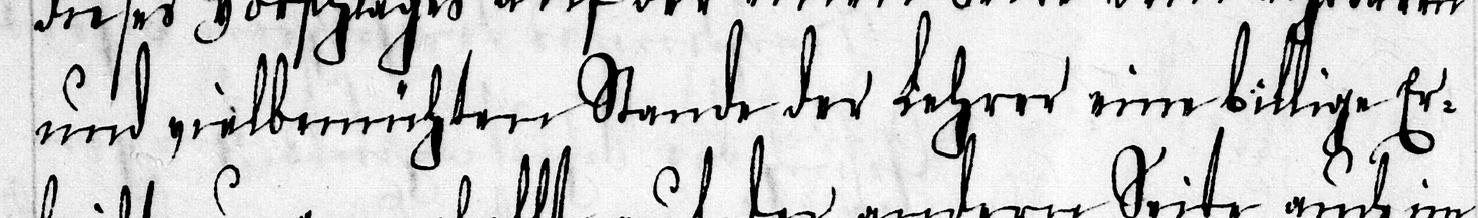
und vielbemühten Stande der Lehrer eine billige E¬
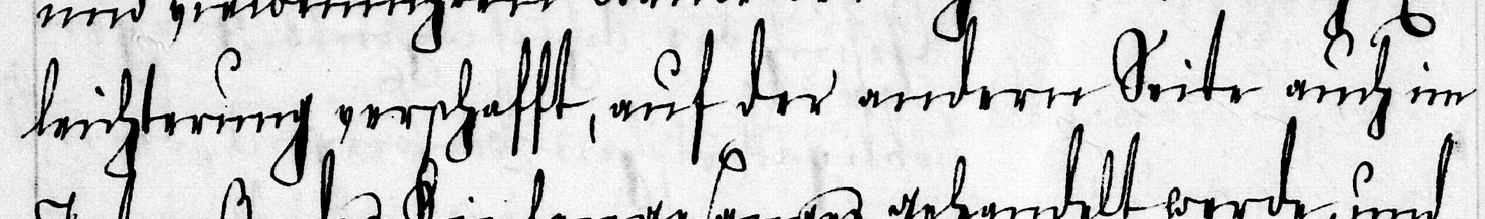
rleichterung verschafft, auf der andern Seite auch im
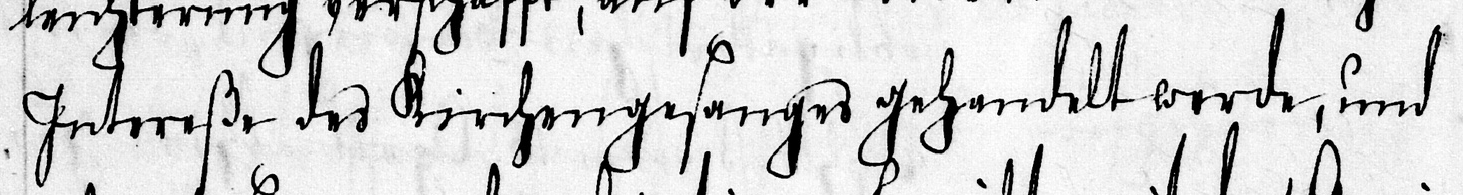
Intereße des Kirchengesanges gehandelt werde, und
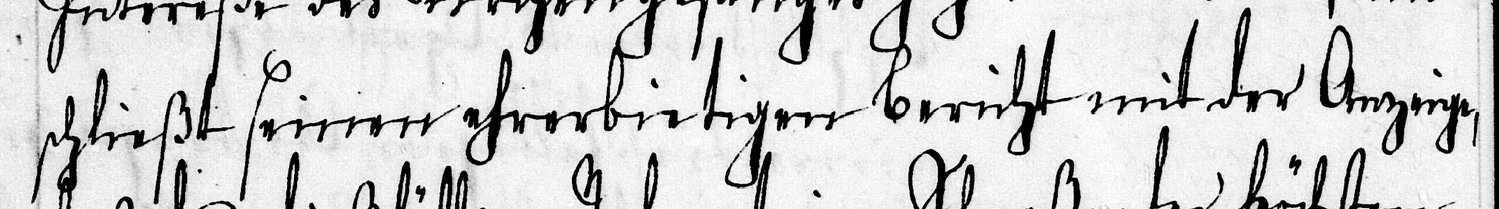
schließt seinen ehrerbietigen Bericht mit der Anzeige,
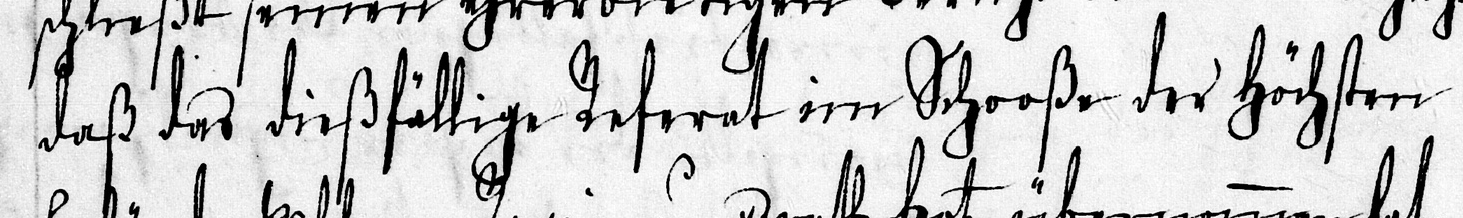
daß das dießfällige Referat im Schooße der Höchsten
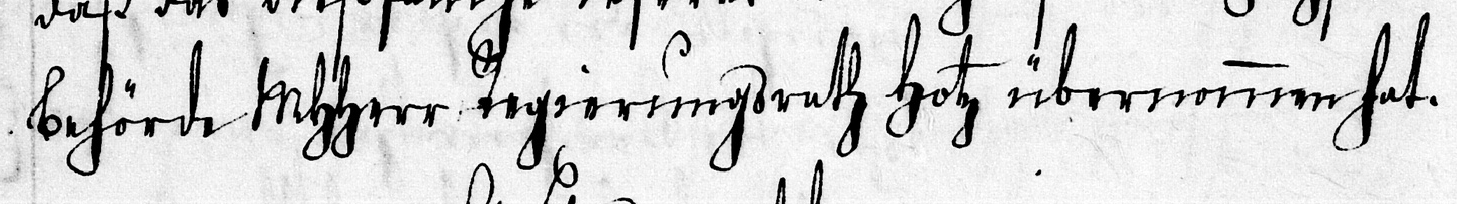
Behörde MHHerr Regierungsrath Hotz übernommen hat.
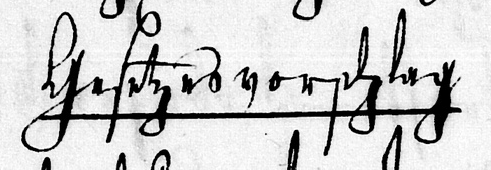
Gesetzesvorschlag
